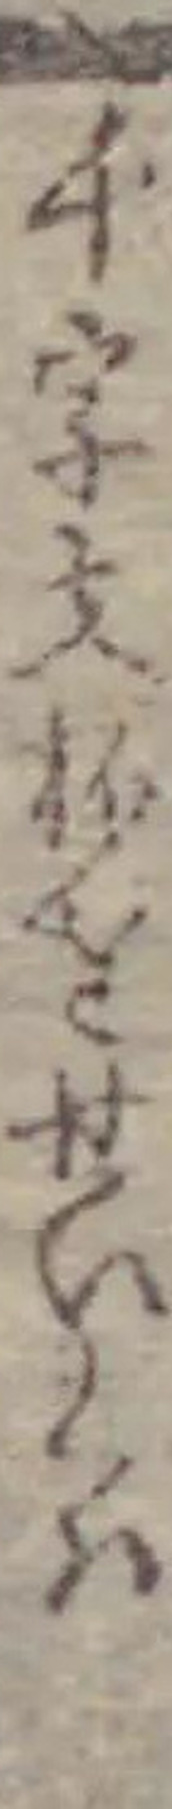千字文抔をせいくは
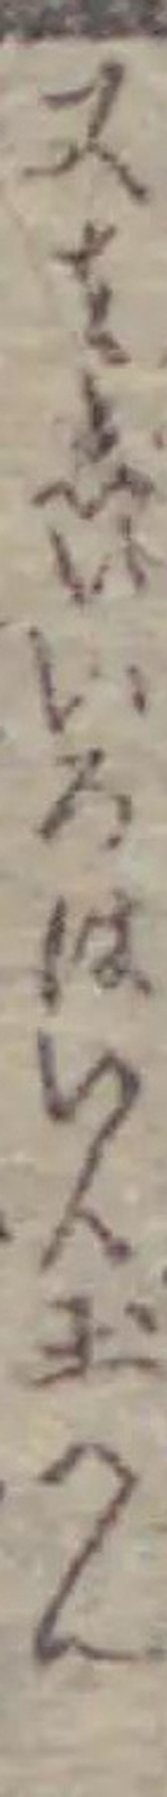又はじいいろはいん玉へん
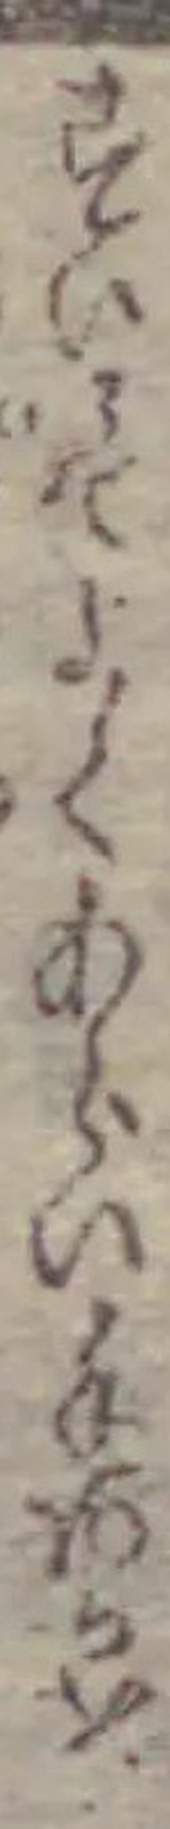すいにてよくあらい手あかを
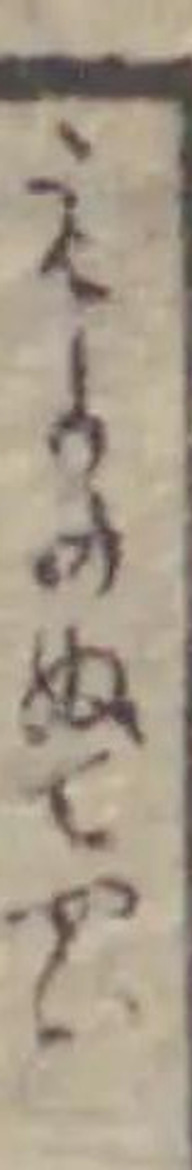もよめぬてやい
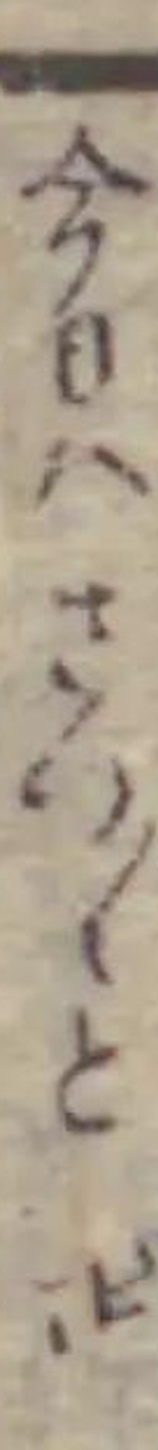今日はさつ〳〵と
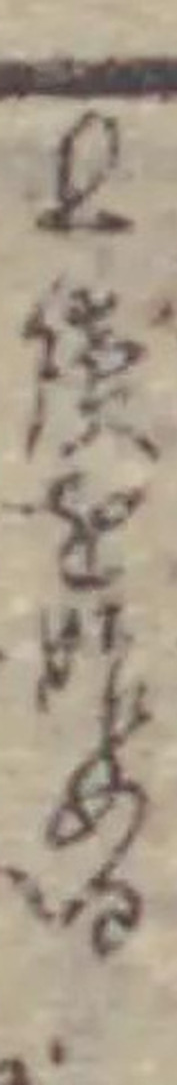読を始める
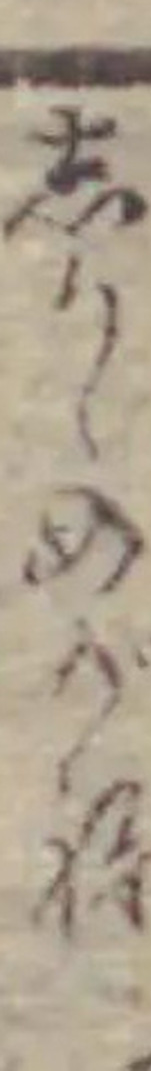しかしめがね
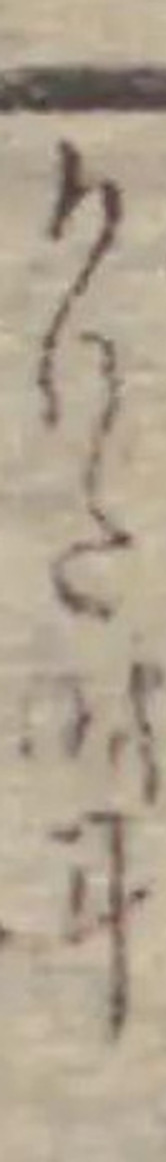かけた時計
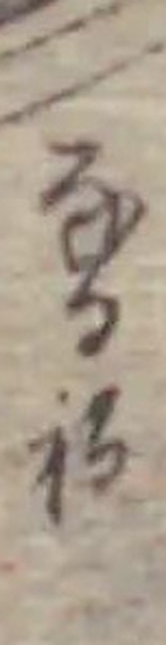なる程
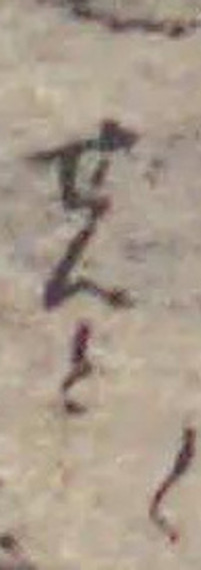せんと
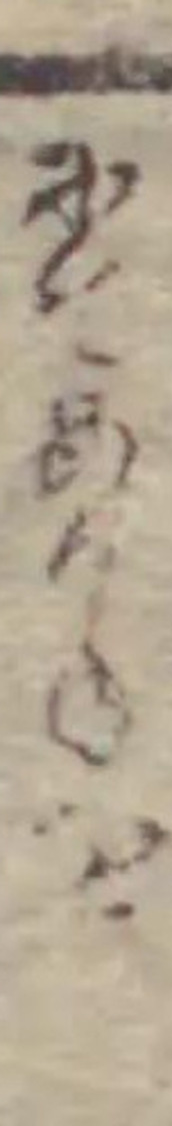にてめかねを
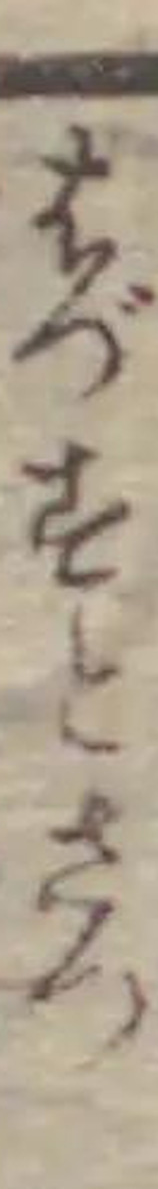はづすとさつ
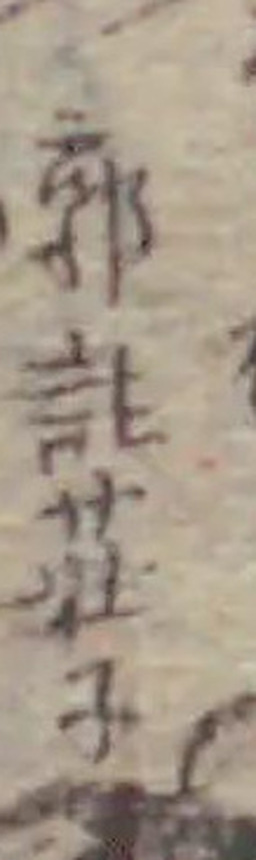郭註荘子
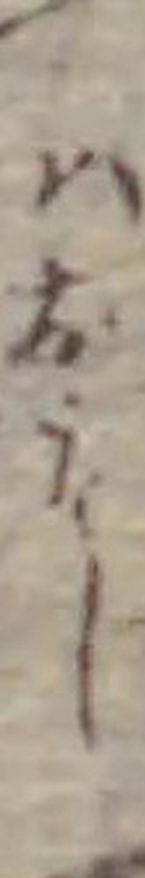はおもし
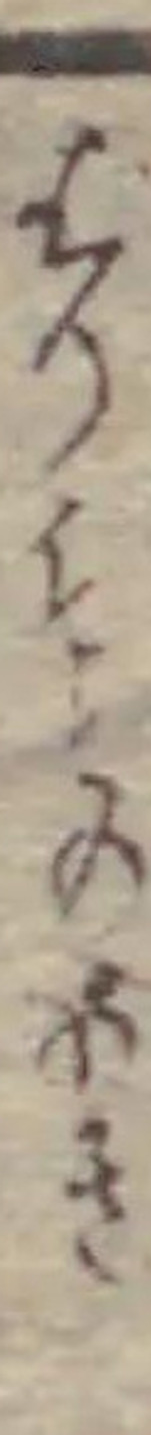はりもとのあき
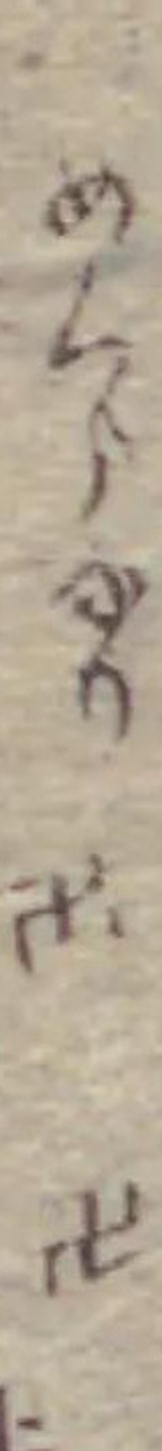めくらなり
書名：栄増眼鏡徳 3巻
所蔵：国立国会図書館 National Diet Library, JAPAN
